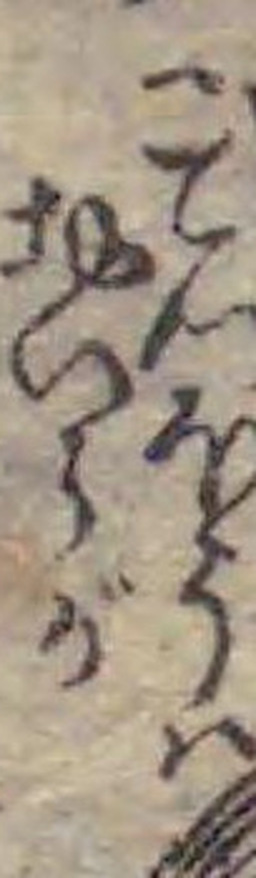おいらが
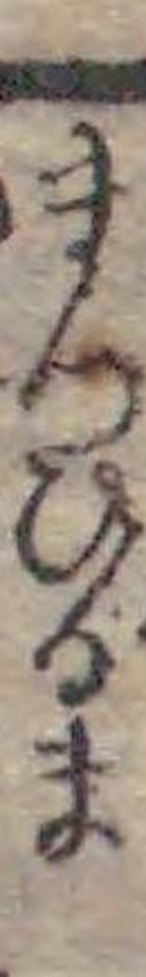まつひるま
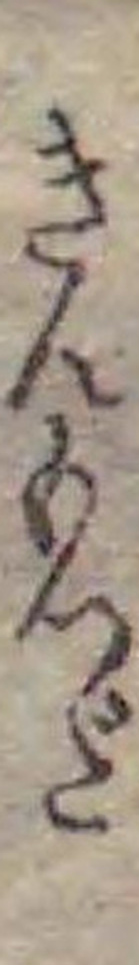きんもつだ
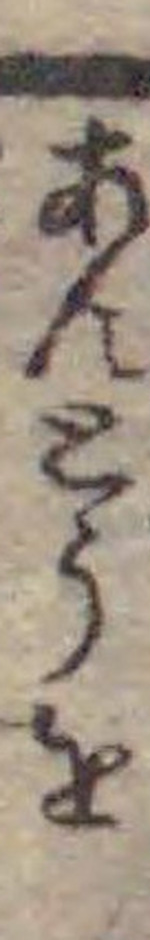あんとうを
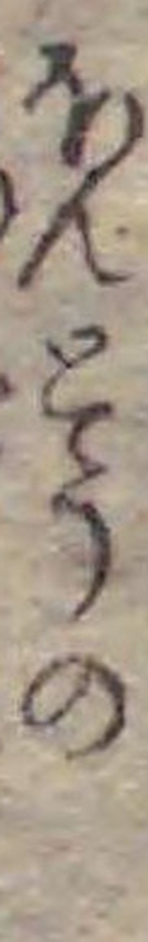ほんとうの
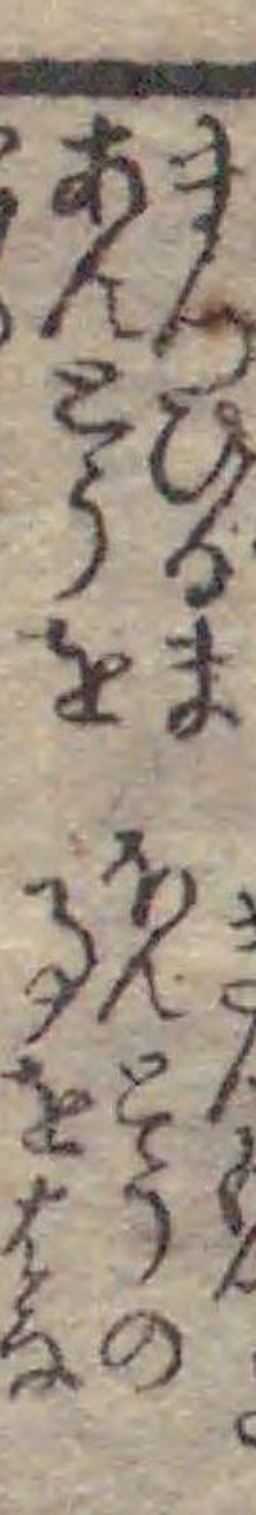あんとうを
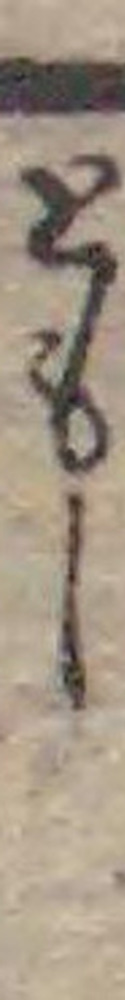ともし
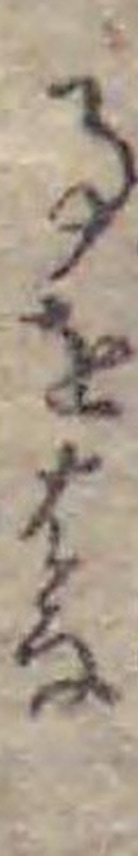事をはな
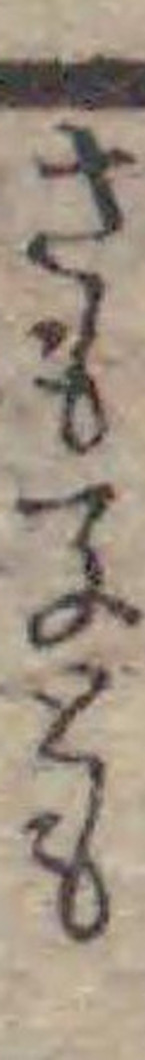さも子とも
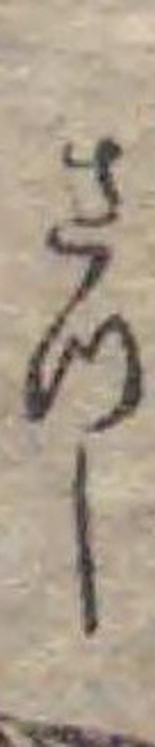さつし
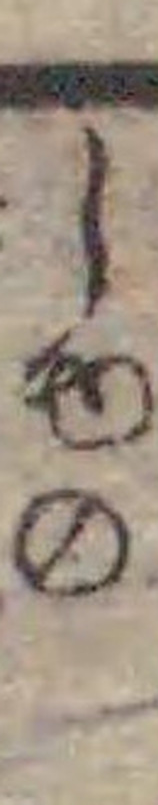しゆの
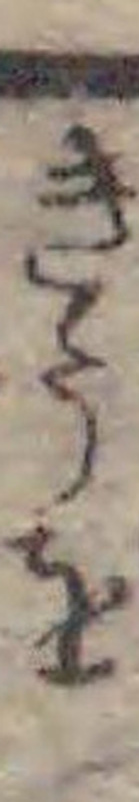きうを
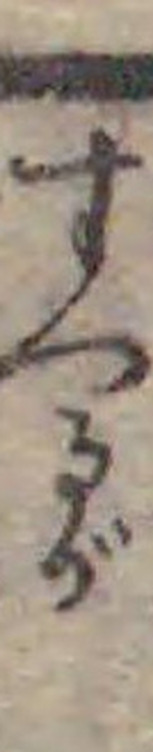すへるが
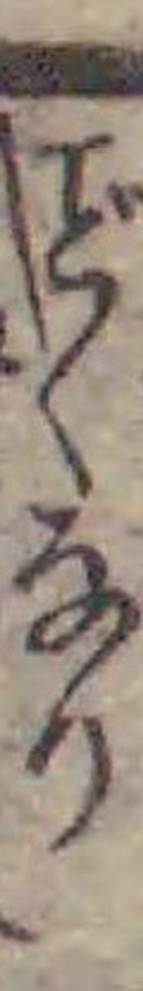ごとくなり
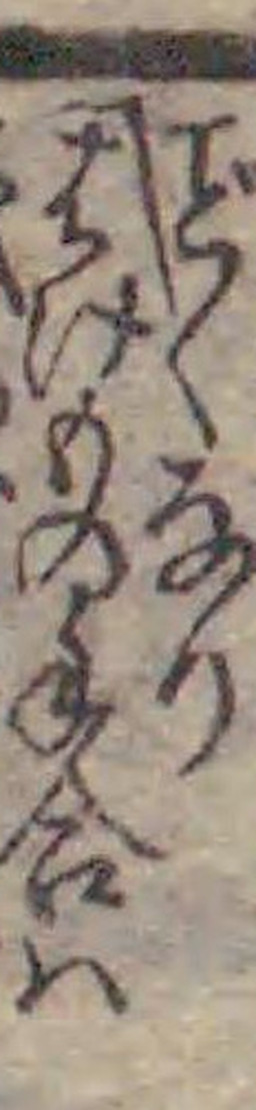〽はけもの手合は
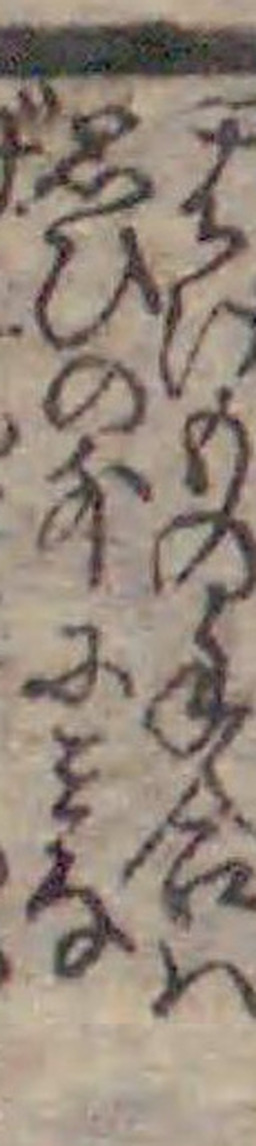思ひの外にみな
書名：怪物つれつれ草 : 2巻
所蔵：国立国会図書館 National Diet Library, JAPAN
